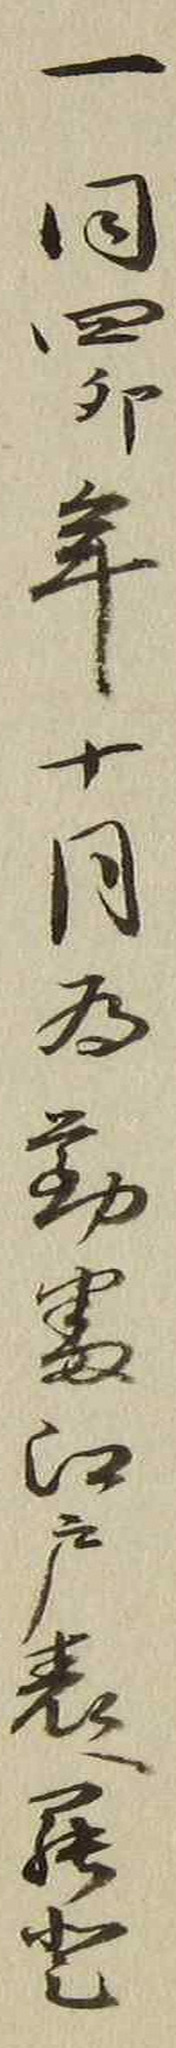一同四卯年十月為勤番江戸表へ罷登
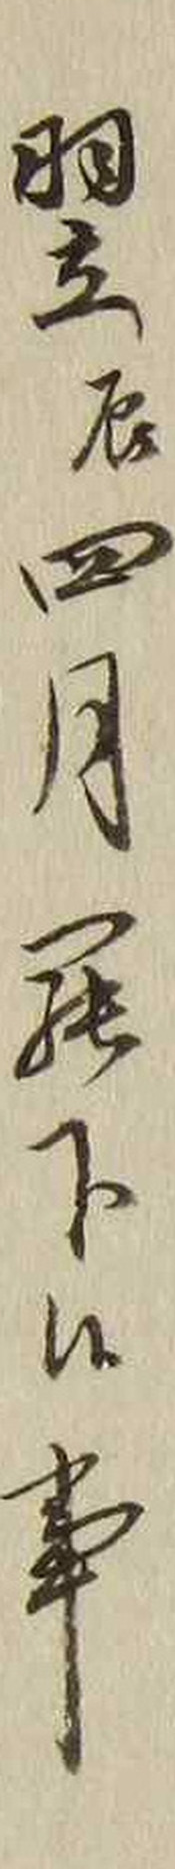翌辰四月罷下候事
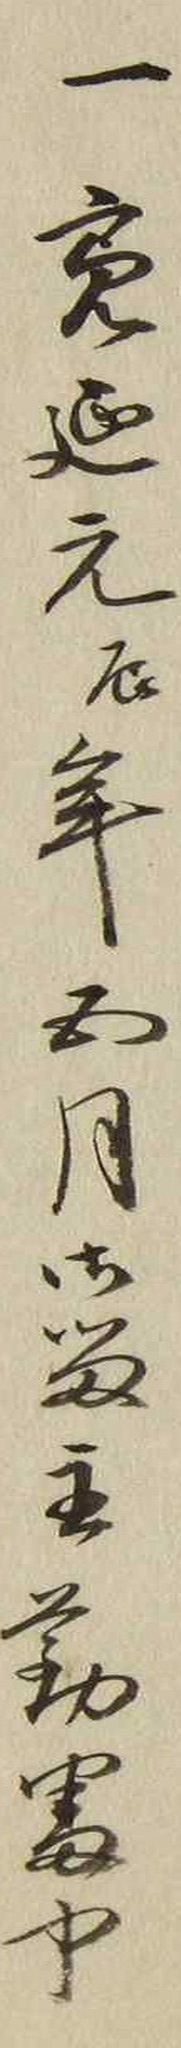一寛延元辰年五月御留主勤番中
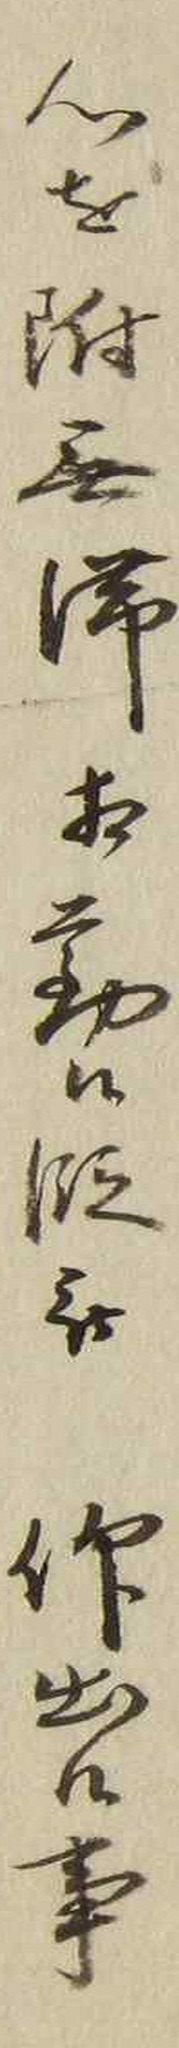心を附無滞相勤候段被仰出候事
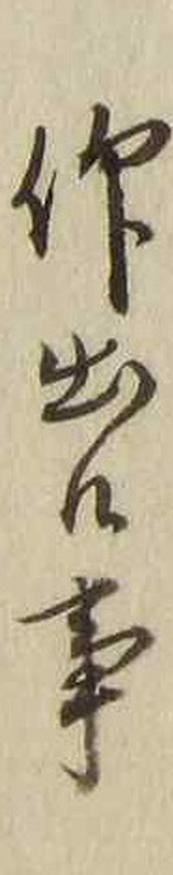仰付候事

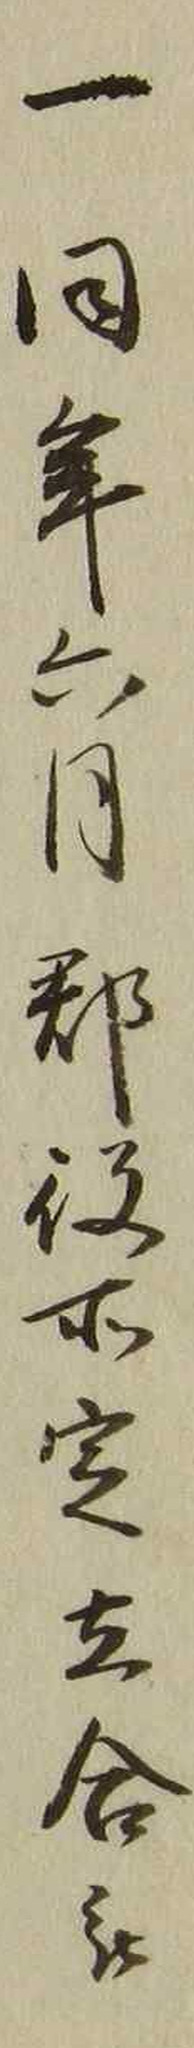一同年六月郡役所定立合被
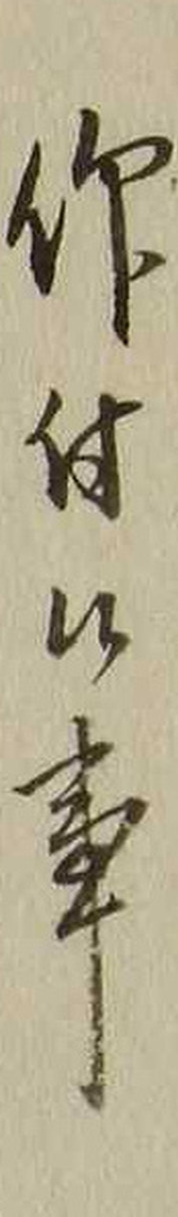仰付候事
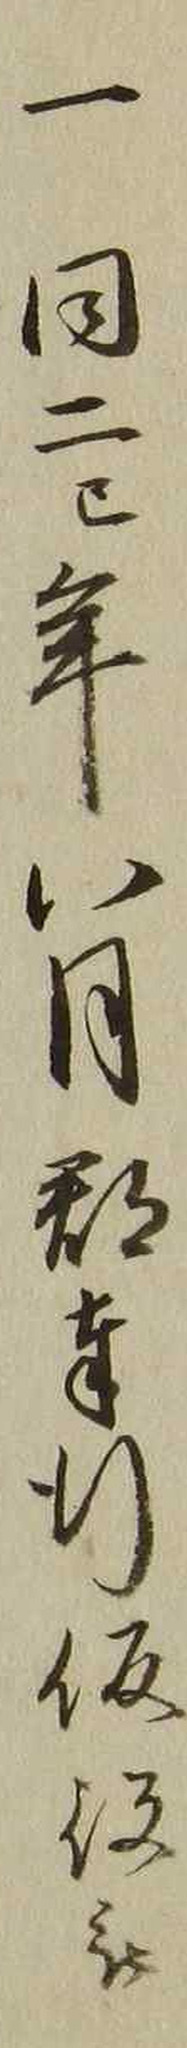一同二巳年八月郡奉行仮役被
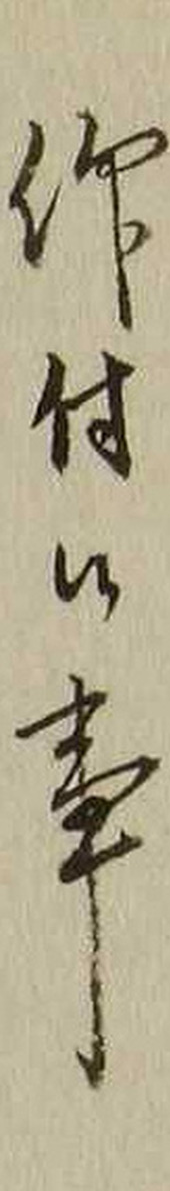仰付候事
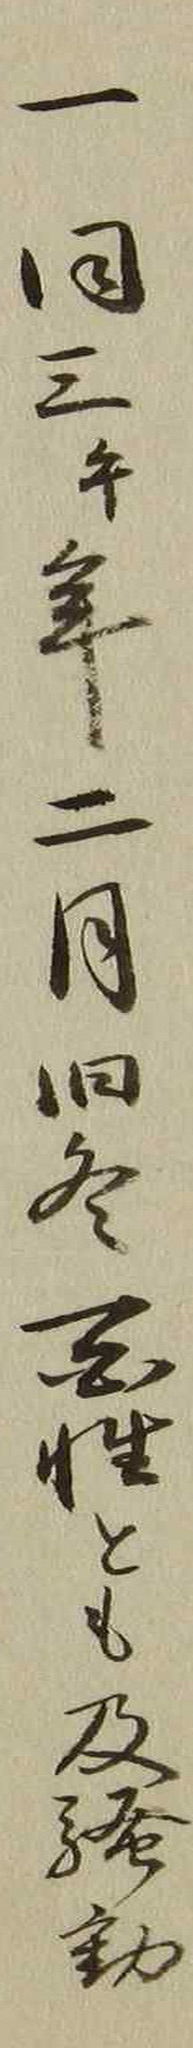一同三午年二月旧冬百性とも及騒動
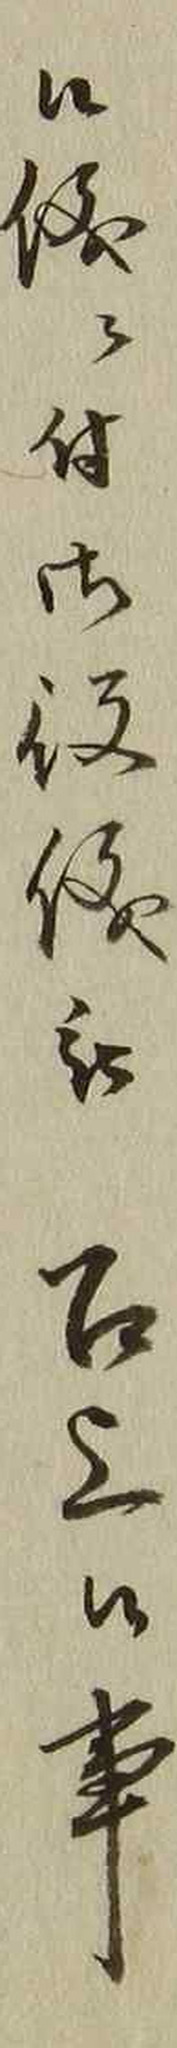候儀ニ付御役儀被召上候事
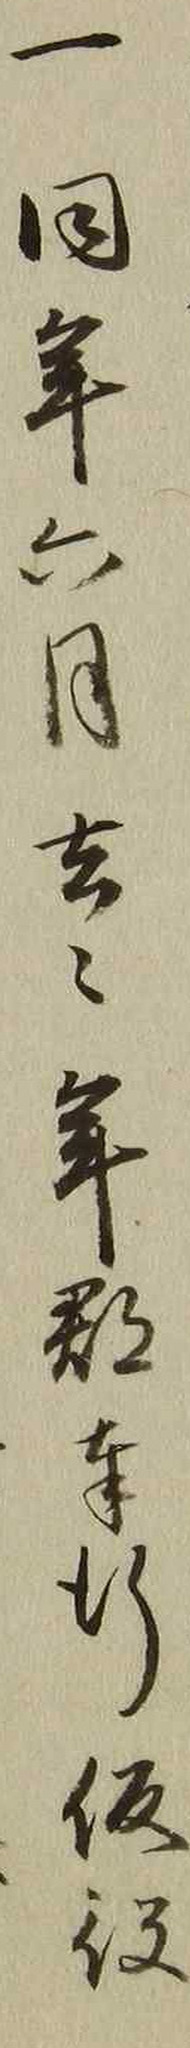一同年六月去々年郡奉行仮役
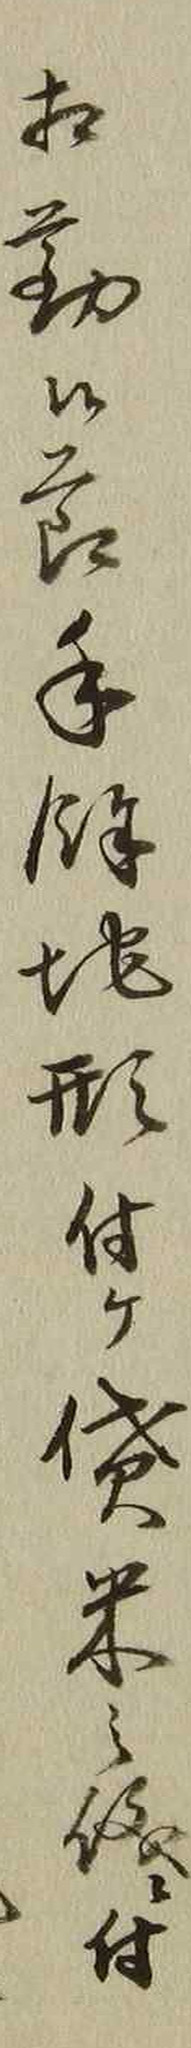相勤候節手余地形付ヶ貸米之儀ニ付
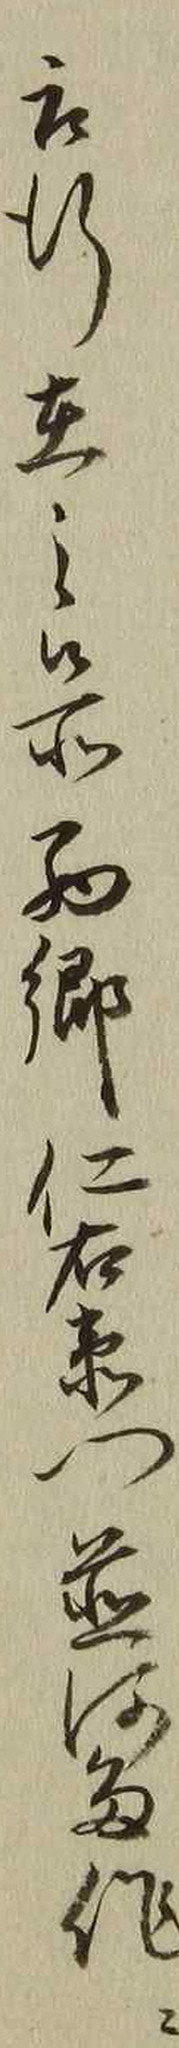取行在之候所西郷仁右衛門並河多作ニ
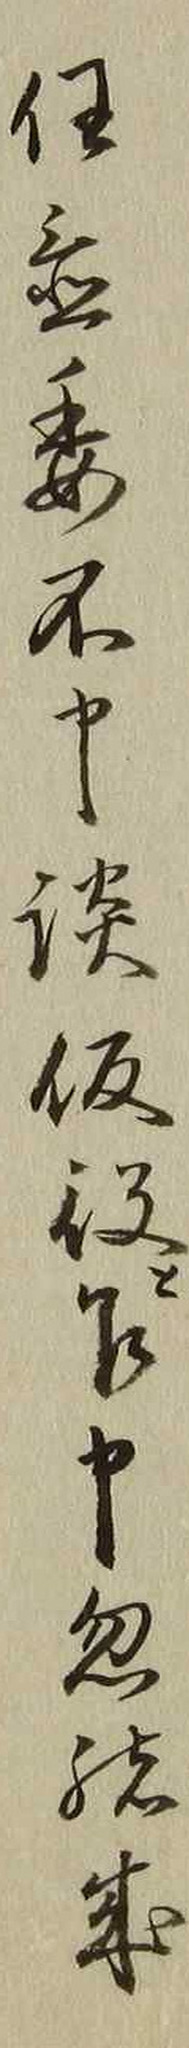任置委不申談仮役と乍申忽諸成
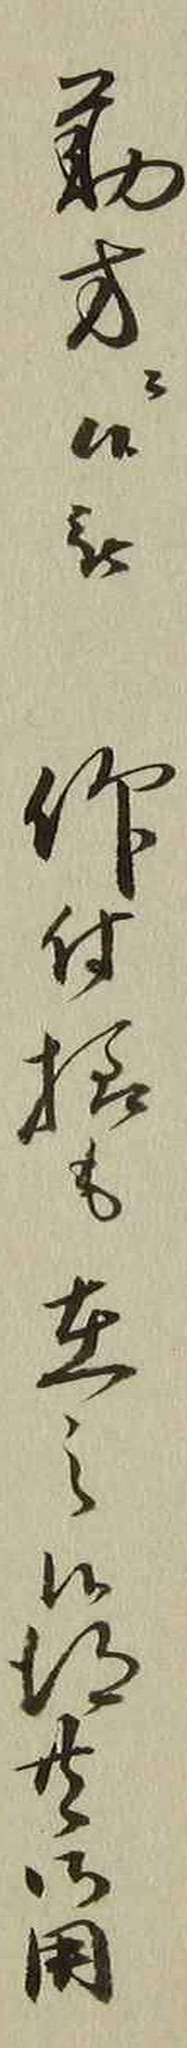勤方ニ候被仰付様も在之候得共御用
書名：諸士系譜　巻之128　た之部4
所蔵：会津若松市立会津図書館
